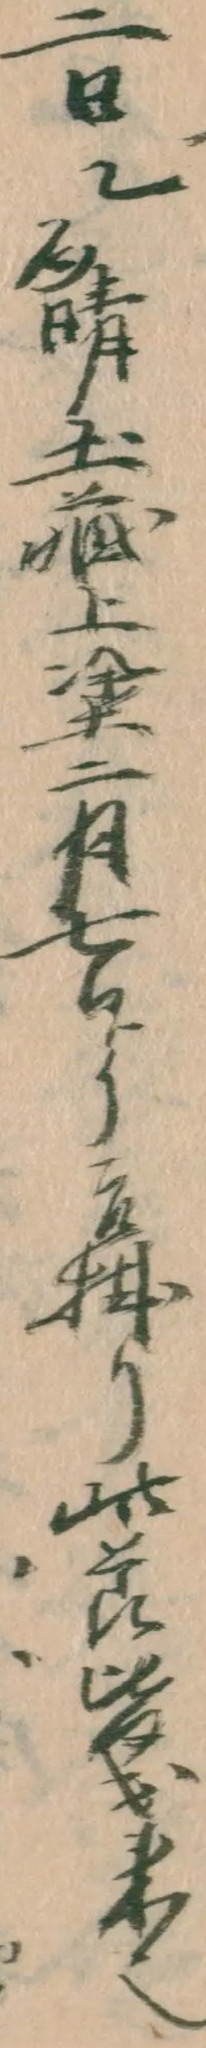三日乙酉晴土蔵上塗二月七日より取掛り此節皆出来也
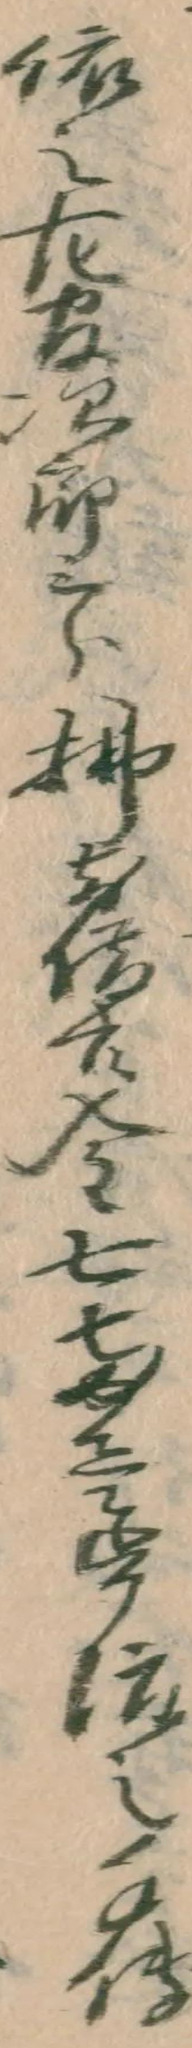依之左官次郎三郎払前借共金七両壱歩渡之手傳
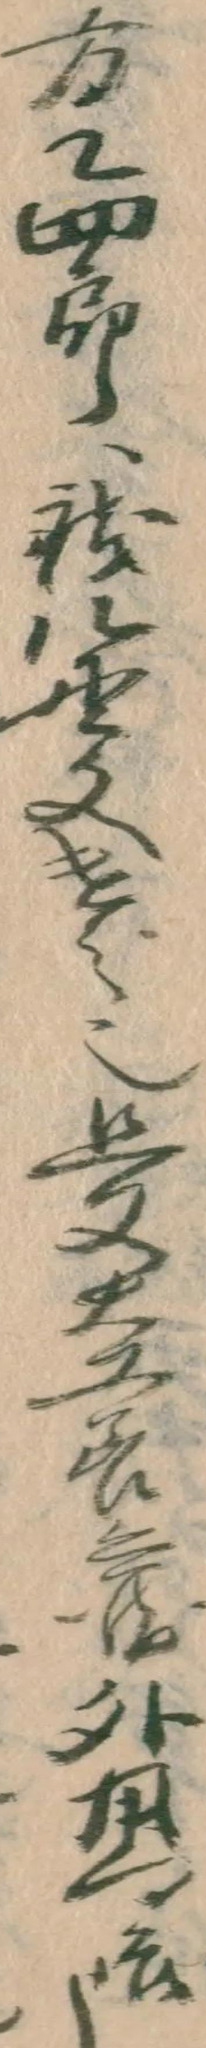方乙四郎へ銭八貫文遣之也且又大工善兵衛外用向ニ付申
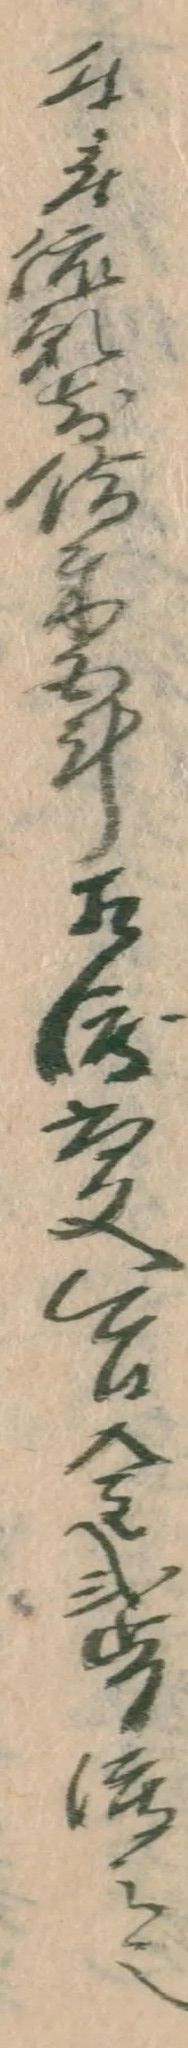付ニ付依願前借米五斗相渡尚又今日金弐歩渡之也
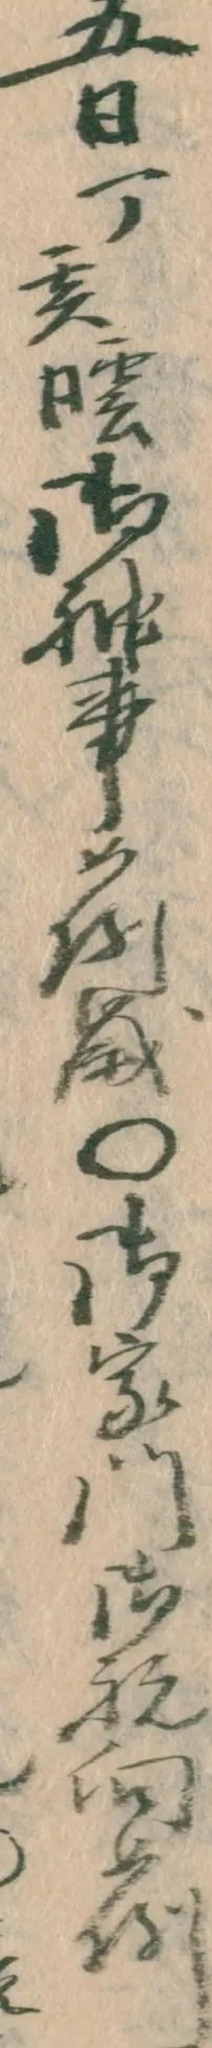五日丁亥曇御神事如例歳○御家門御祝向如例
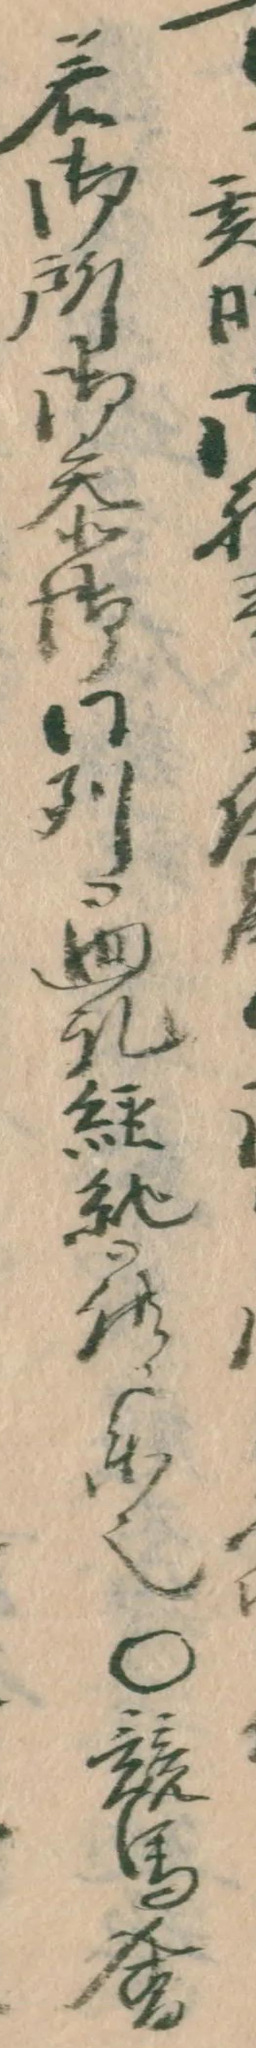若御所御参御同列御廻禮経紀御供ニ参也○競馬會
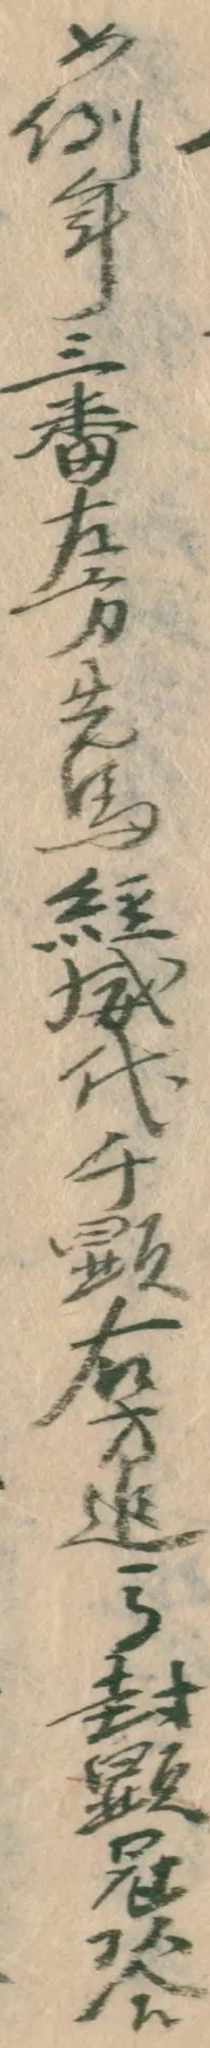如例年三番左方先馬経威代千顕右方追馬封顕冠頭合
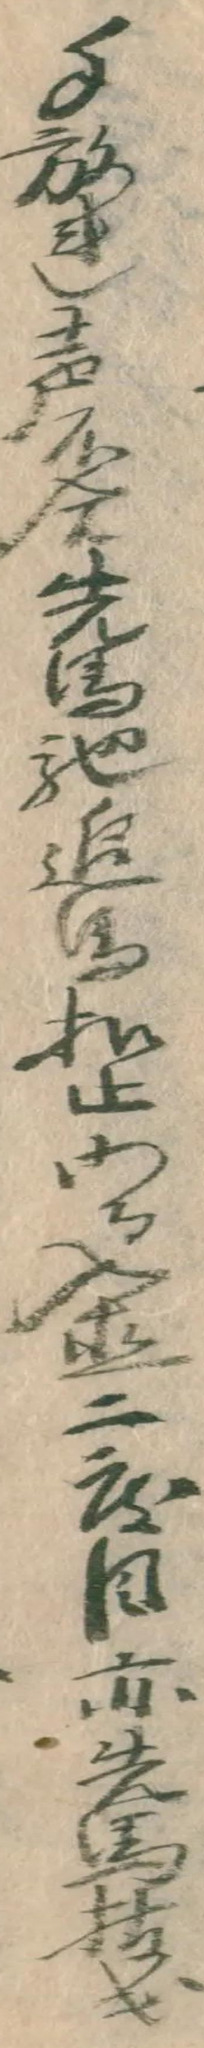手放れ番不合先馬馳追馬扣止仍而入直二度目亦先馬抜出
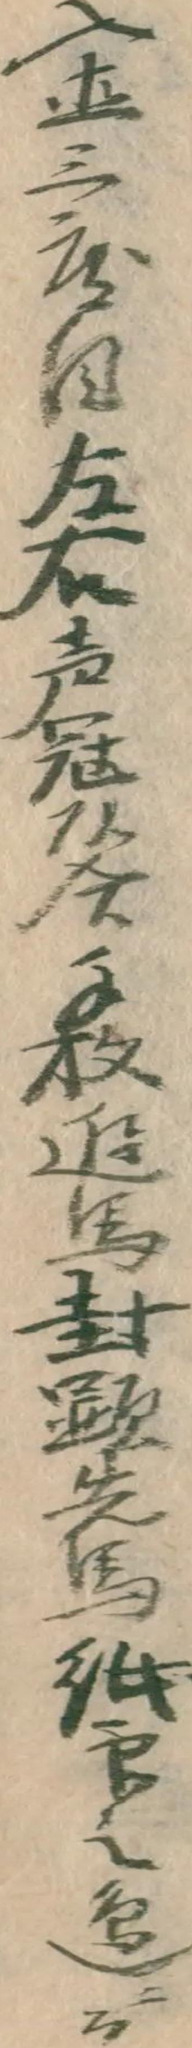入直三度目左右声冠頭合手枚追馬封顕先馬紙印之邊ニ而
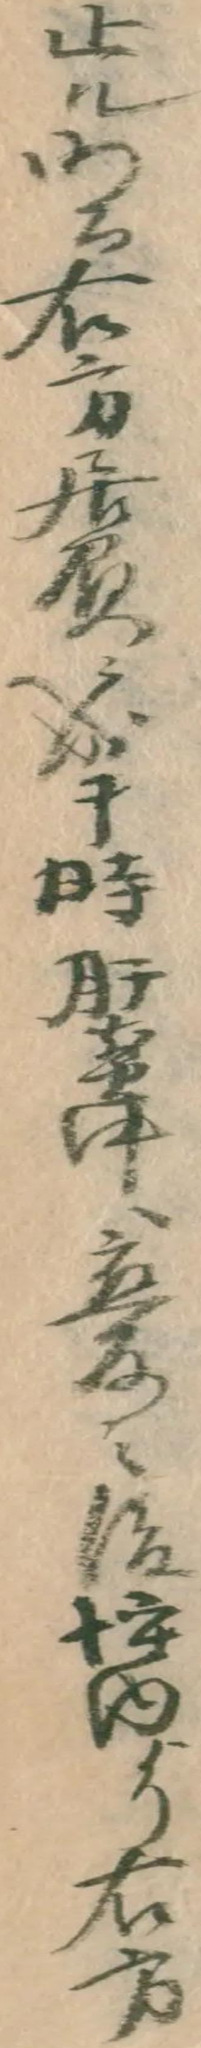止ル仍而右方居負二成于時肝煎中へ立反之後埒内より右方

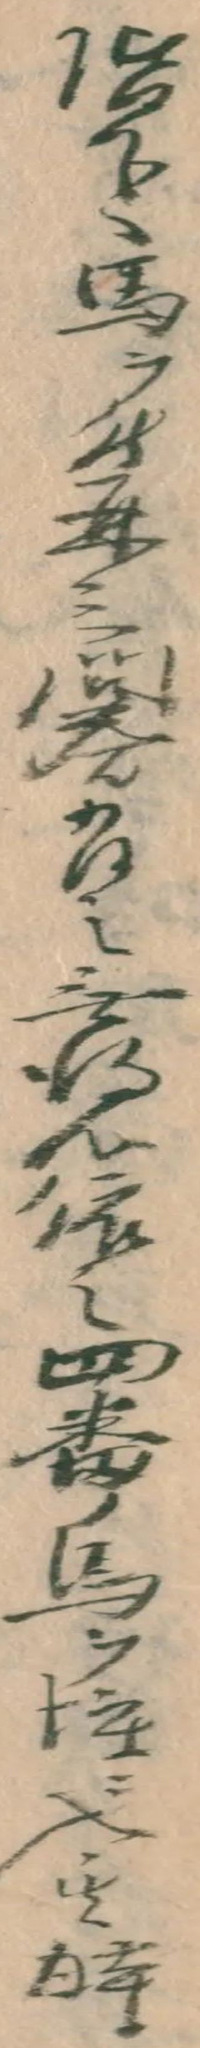階下へ馬ヲ付再三問合有之無得心依之四番ノ馬ヲ埒ニ入其時
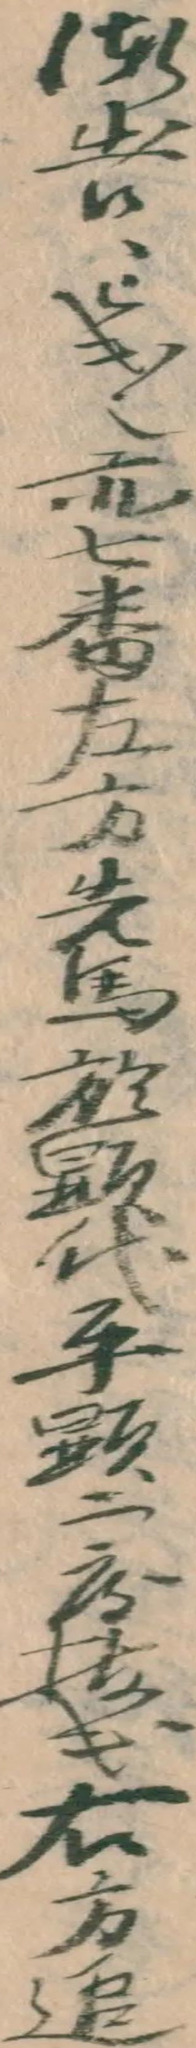漸出候へ被出也亦七番左方先馬於顕代平顕二度抜出右方追
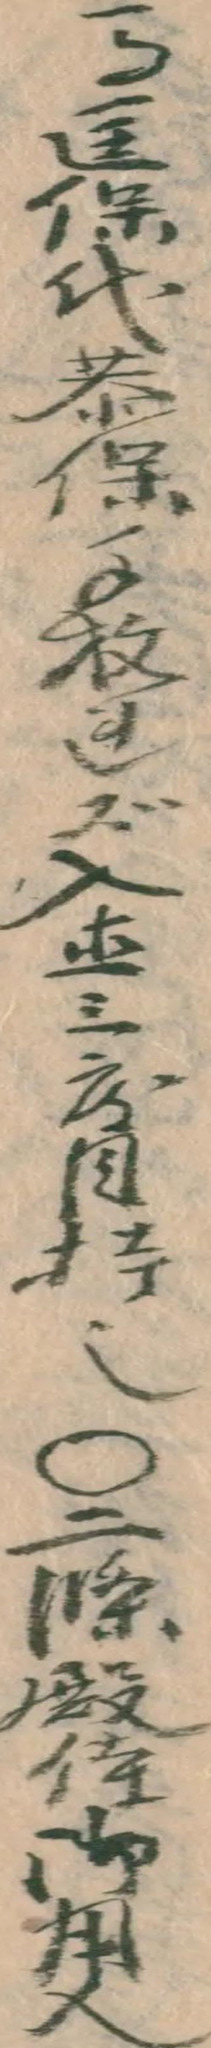馬匡保代恭保手放れズ入直三度目持也○二條殿侍御用人
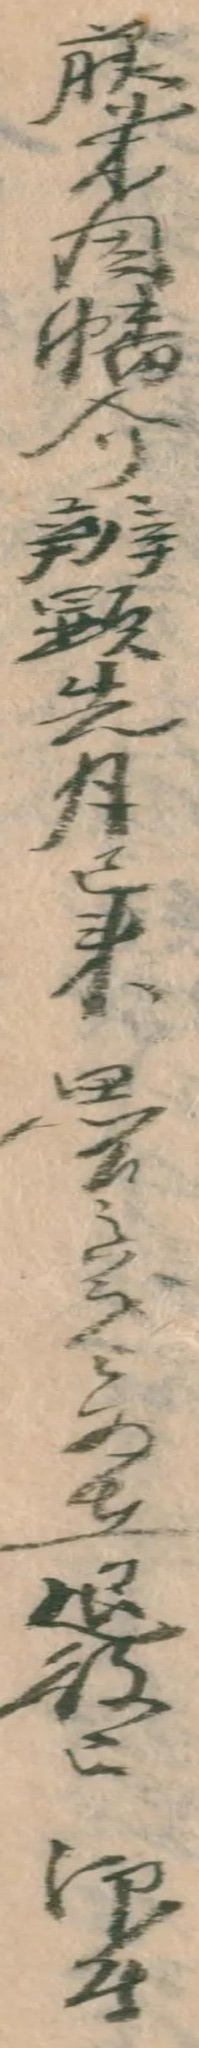藤木因幡介辨顕先月已来思召之義被為在退役被仰付
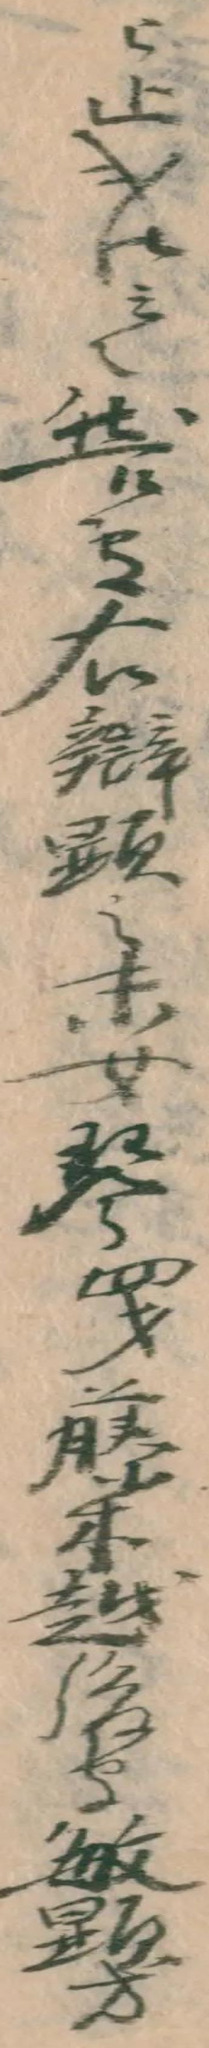被止出仕云々然ル處右辨顕之末女琴四才藤木越後守敏顕方
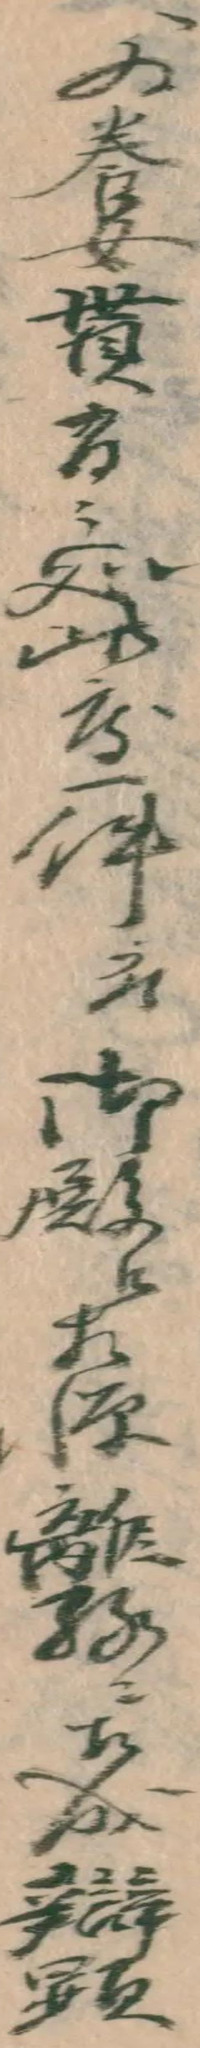ヘ為養女貰有之処此度一件ニ付御殿江相願離縁ニ相成辨顕
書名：賀茂社記録. 第67冊
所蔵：国立国会図書館 National Diet Library, JAPAN
